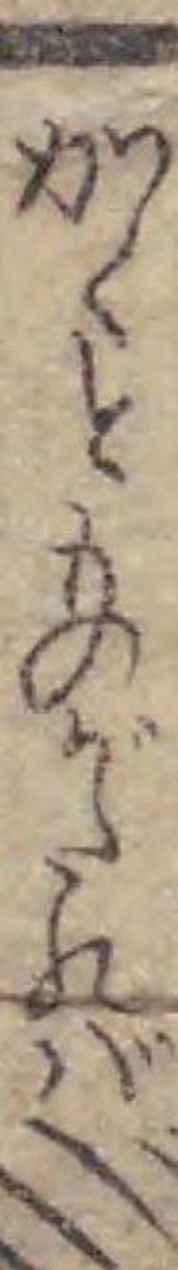かくとものがたれば
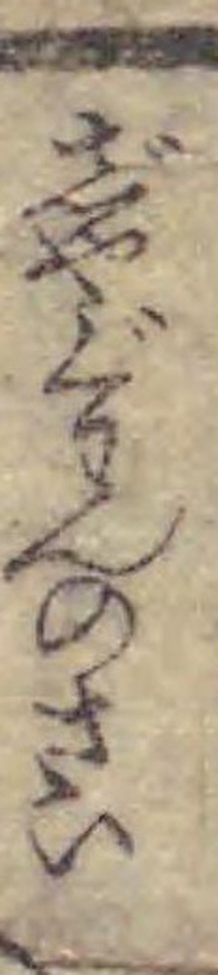じやぐわんのさい
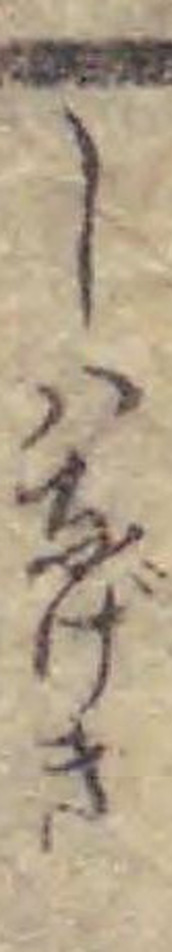しはなげき
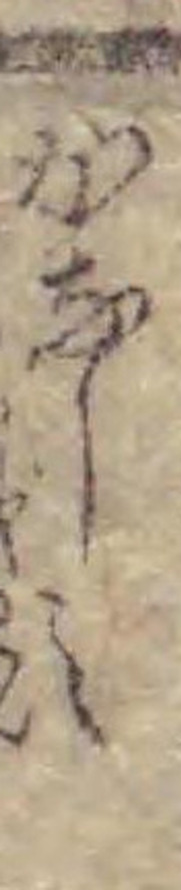かなしみ
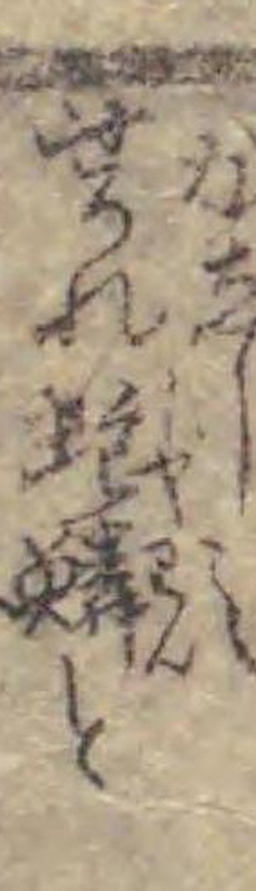せかれ蛇鱗と
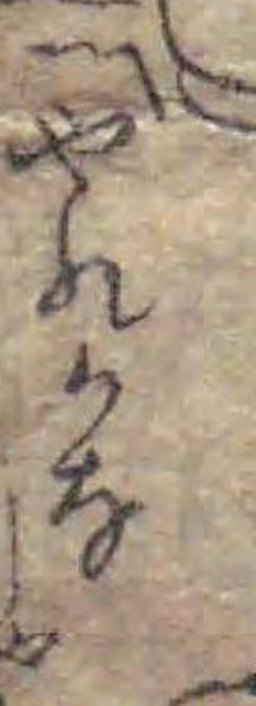やれかな
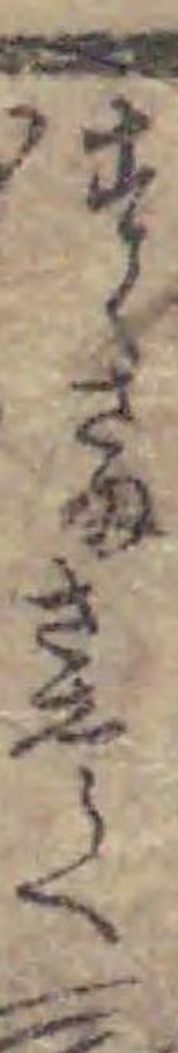すくさまさしうへ
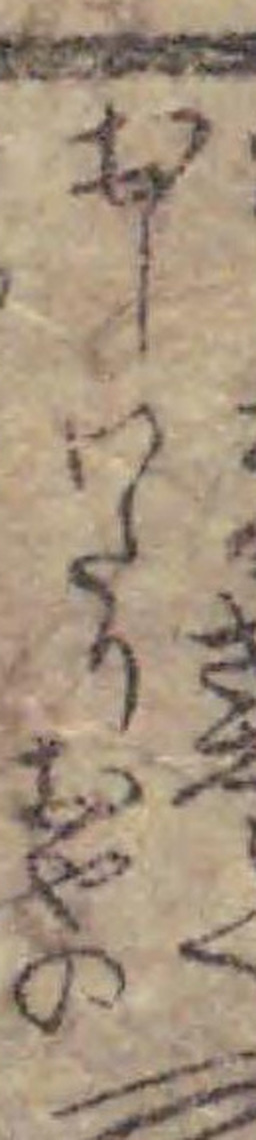おしわたりおやの
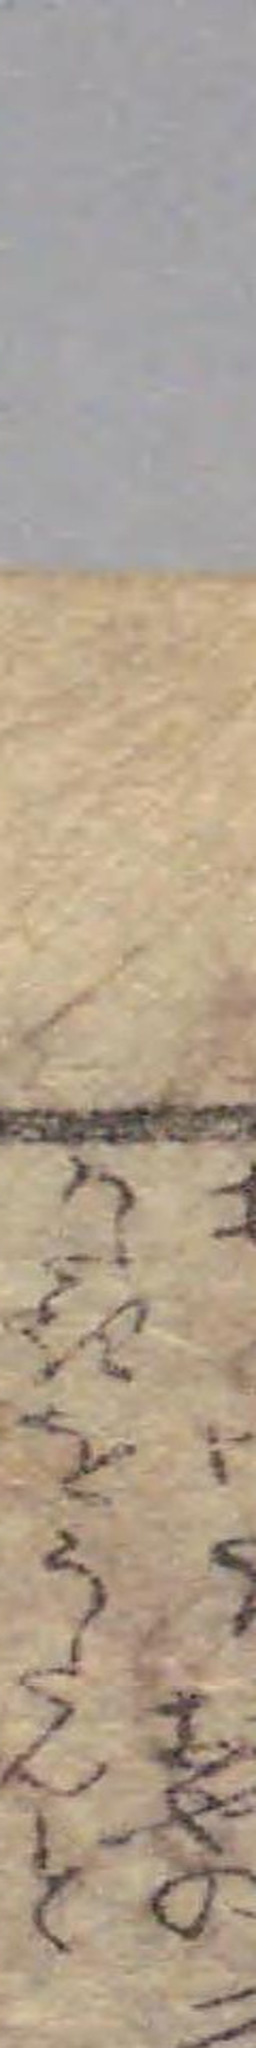かたきをうたんと
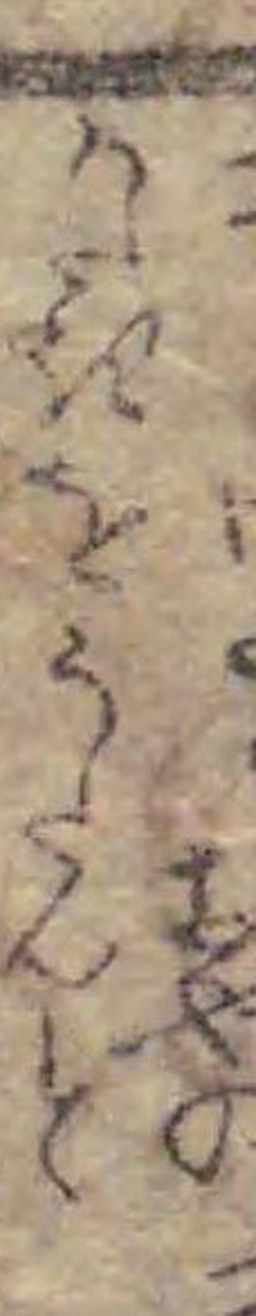かたきをうたんと
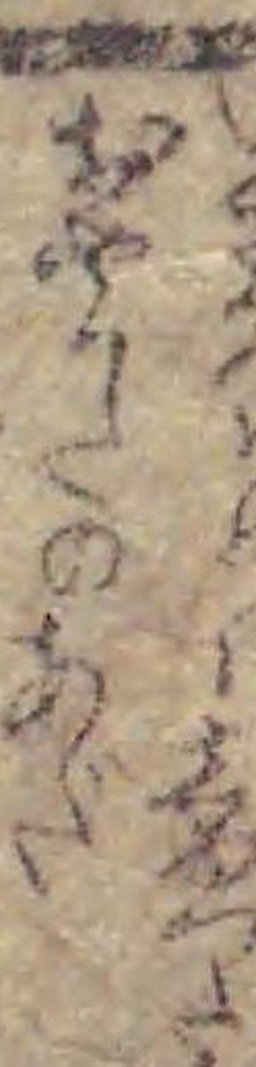おやかたのあだ
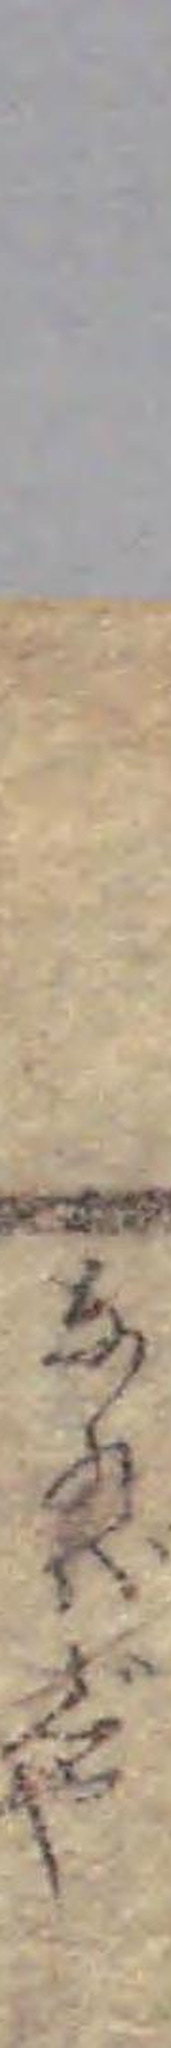なればじや
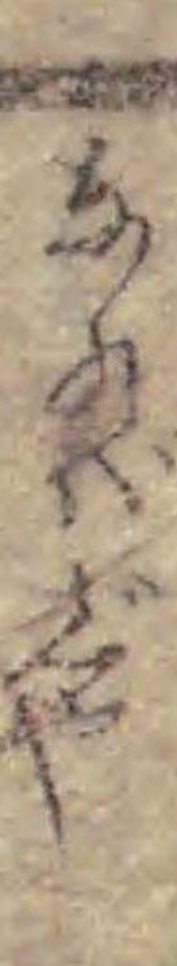なればじや
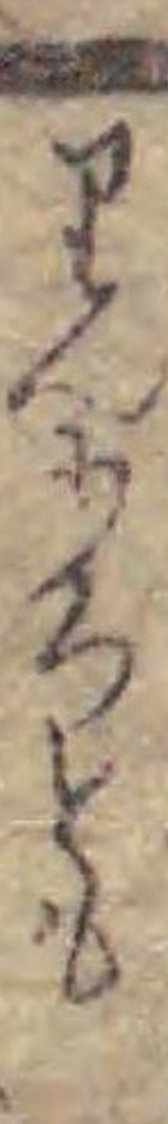りんもろとも
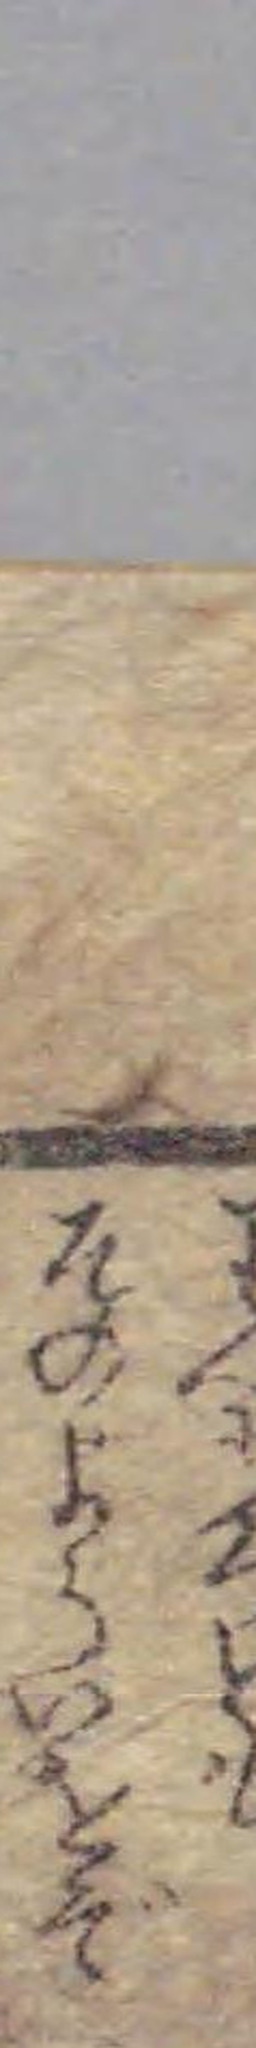そのよういをぞ
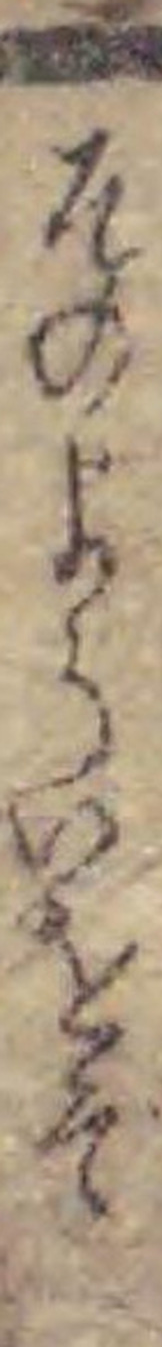そのよういをぞ
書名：化物世界夜半嵐 : 3巻
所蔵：国立国会図書館 National Diet Library, JAPAN
